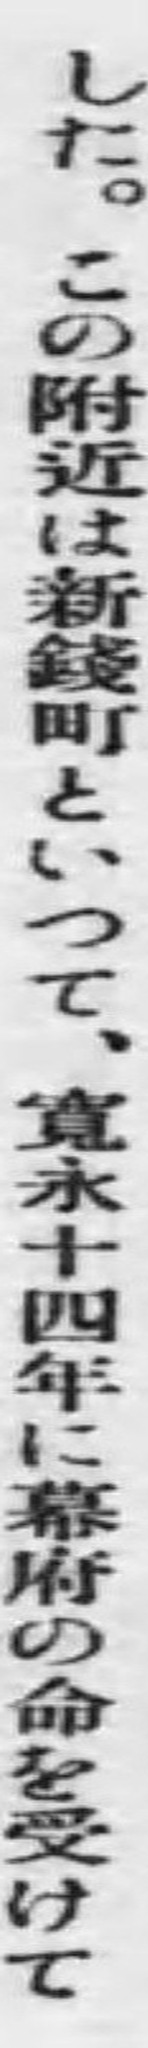した。この附近は新銭町といつて、寛永十四年に幕府の命を受けて
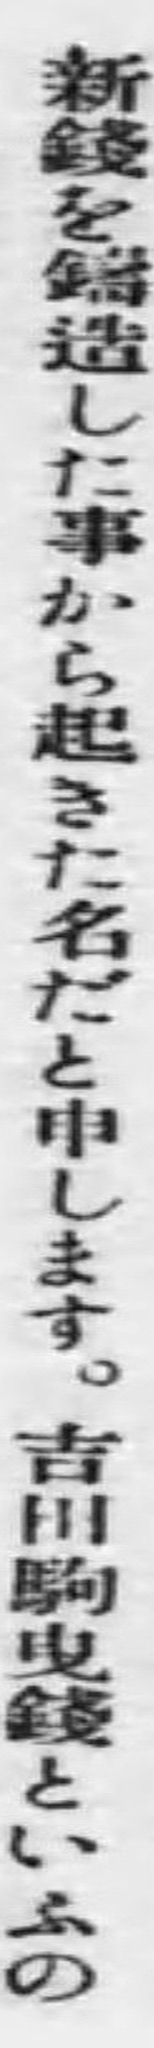新銭を鋳造した事から起きた名だと申します。吉川駒曳銭といふの
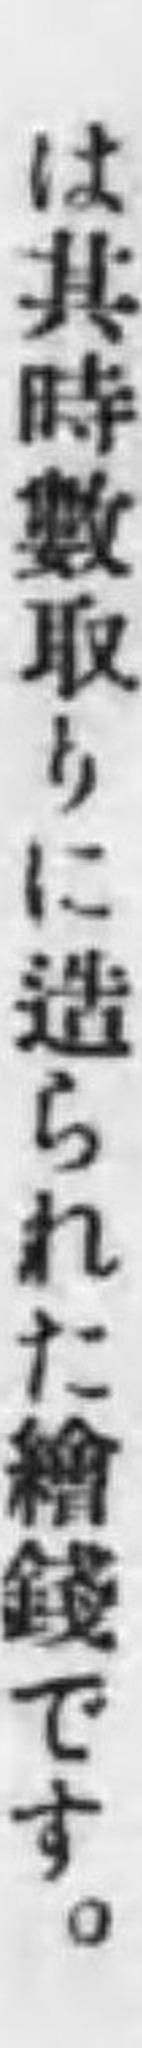は其時数取りに造られた絵銭です。
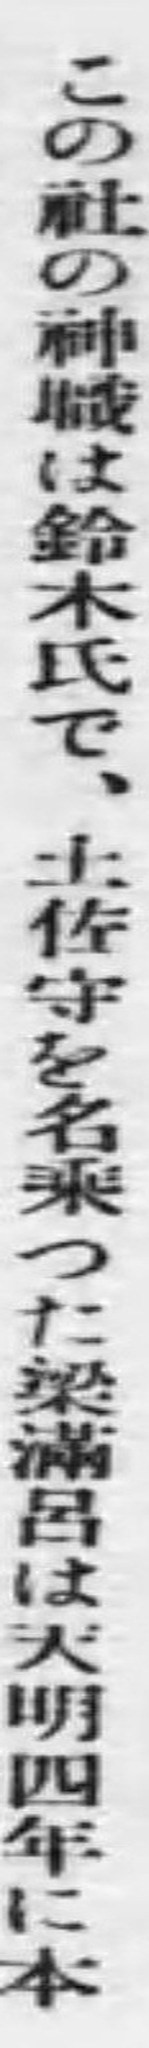この社の神職は鈴木氏で、土佐守を名乗つた梁満呂は天明四年に本
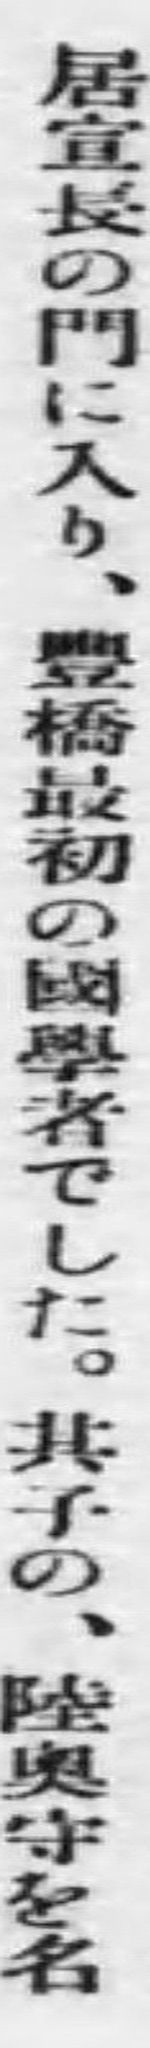居宣長の門に入り、豊橋最初の国学者でした。其子の、陸奥守を名
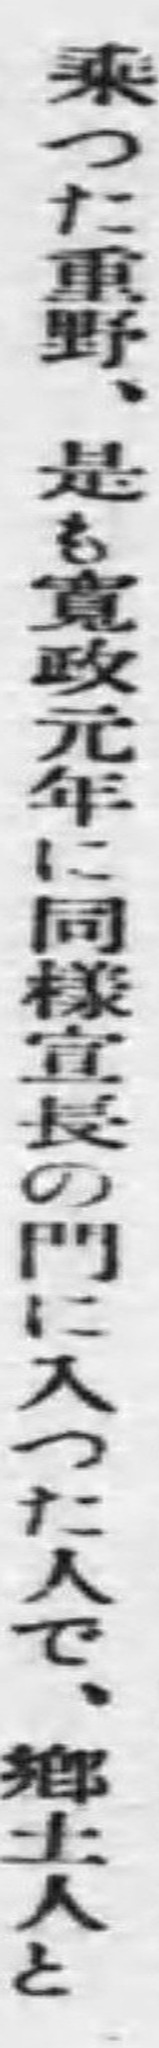乗つた重野、是も寛政元年に同様宣長の門に入った人で、郷土人と
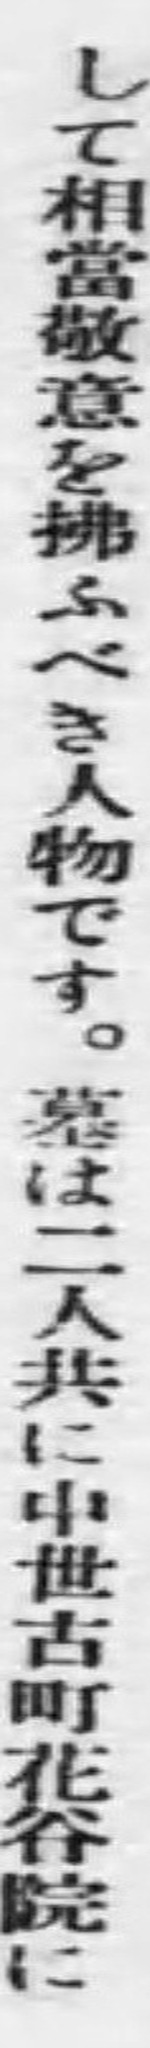して相当敬意を払ふべき人物です。墓は二人共に中世古町花谷院に
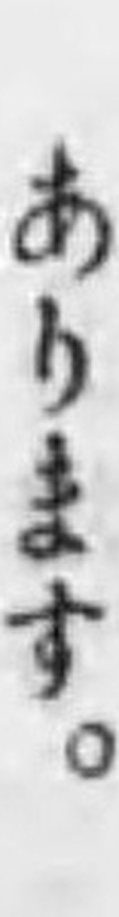あります。
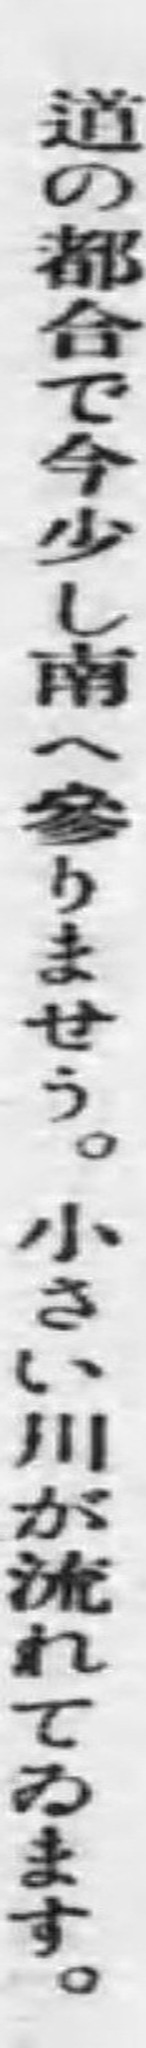道の都合で今少し南へ参りませう。小さい川が流れてゐます。
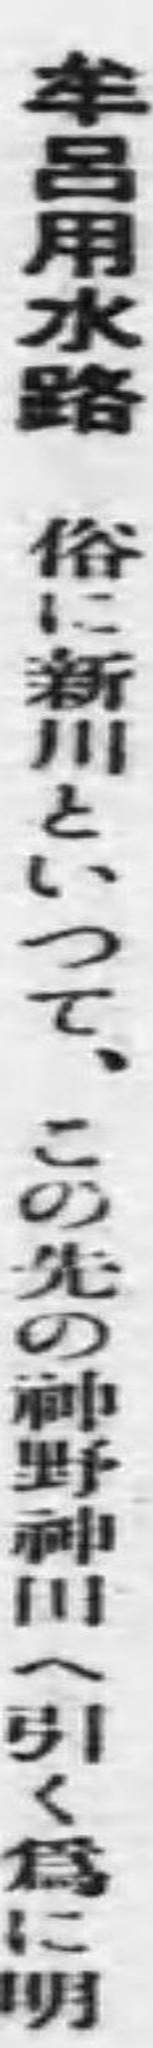牟呂用水路俗に新川といつて、この先の神野神田へ引く為に明

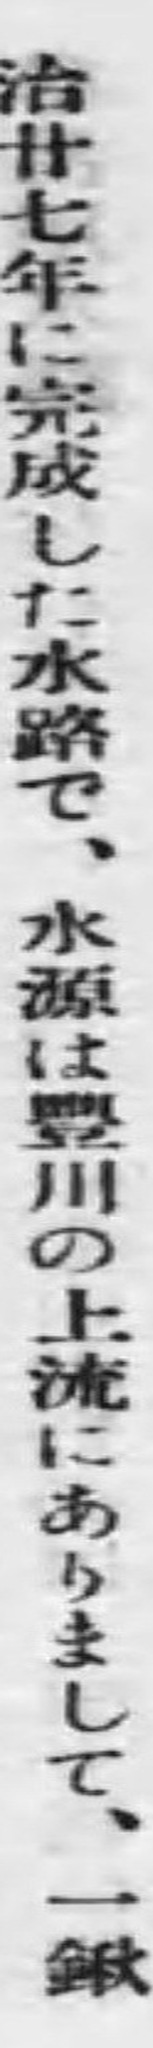治廿七年に完成した水路で、水源は豊川の上流にありまして、一鍬
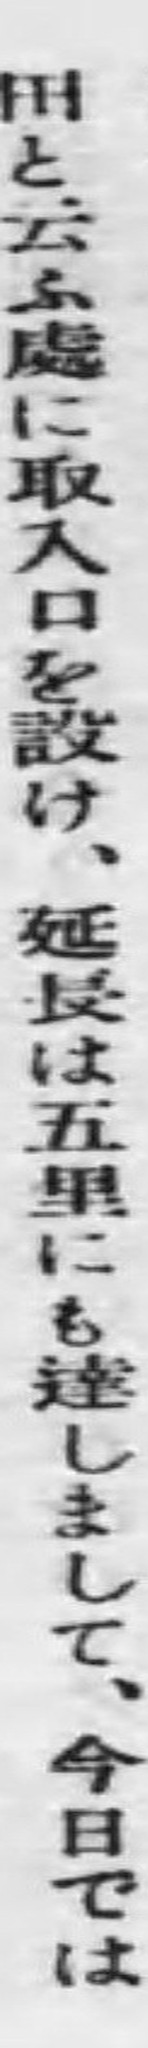田と云ふ処に取入口を設け、延長は五里にも達しまして、今日では
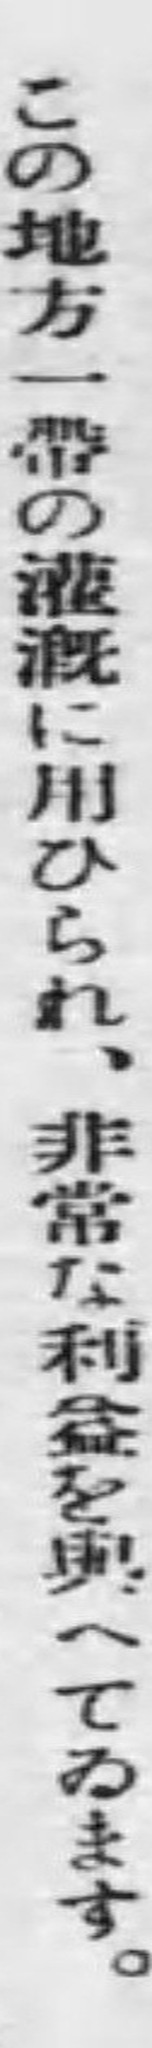この地方一帯の灌漑に用ひられ、非常な利益を与へてゐます。
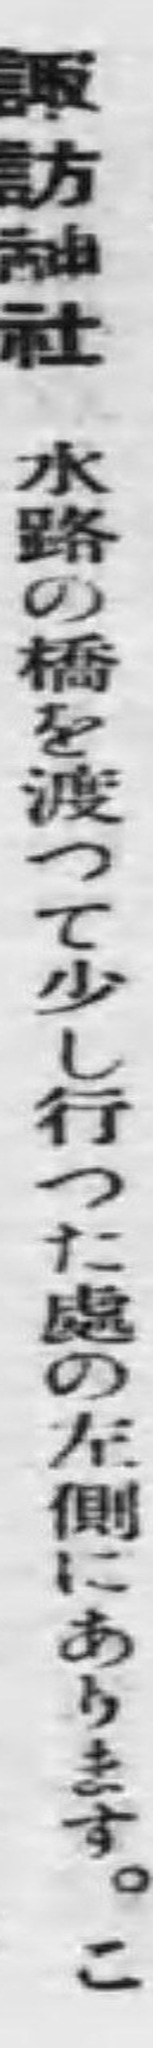諏訪神社水路の橋を渡つて少し行つた処の左側にあります。こ
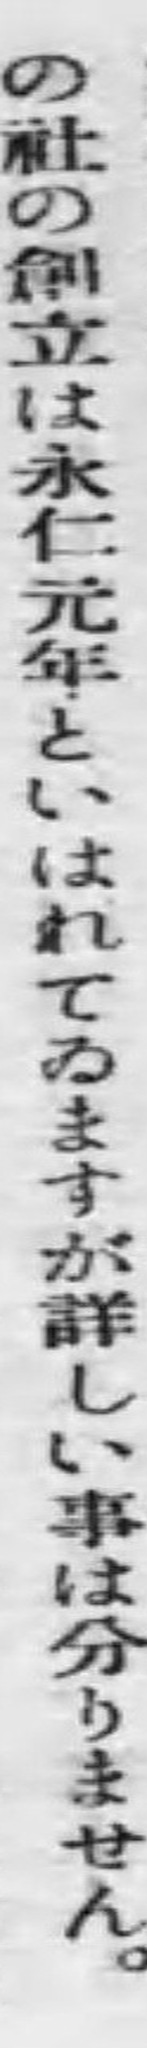の社の御立は永仁元年といはれてゐますが詳しい事は分りません。
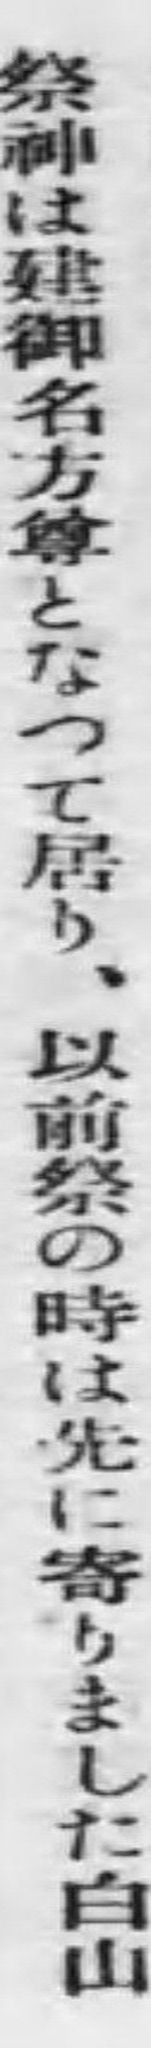祭神は建御名方尊となつて居り、以前祭の時は先に寄りました白山
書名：東三河道中記 : 豊橋市及其附近案内
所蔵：国立国会図書館 National Diet Library, JAPAN
